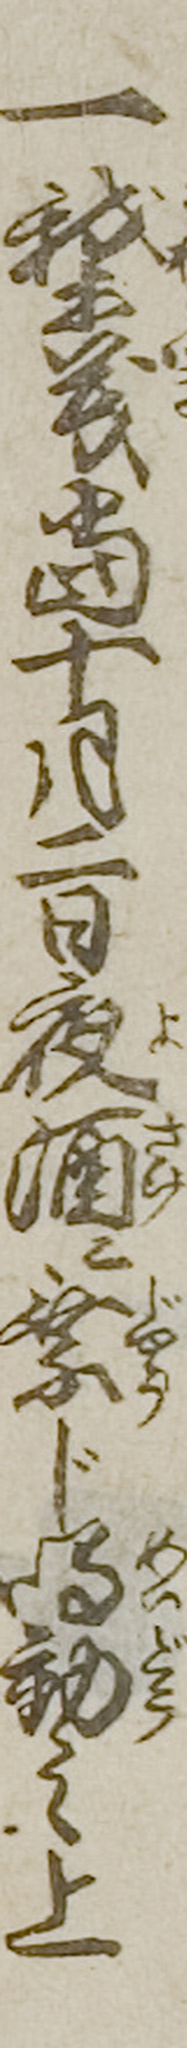一我等義当十月二日夜酒に乗じ鳴動の上
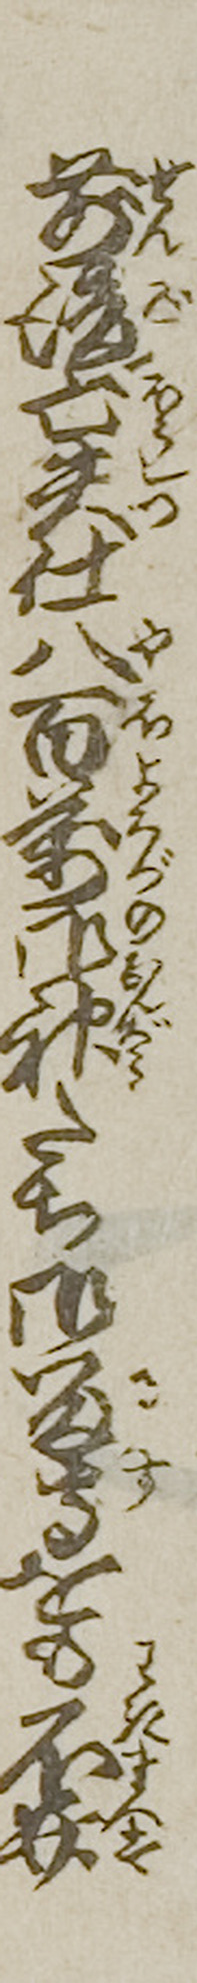前後亡失仕八百万御神たち御留守をも不弁
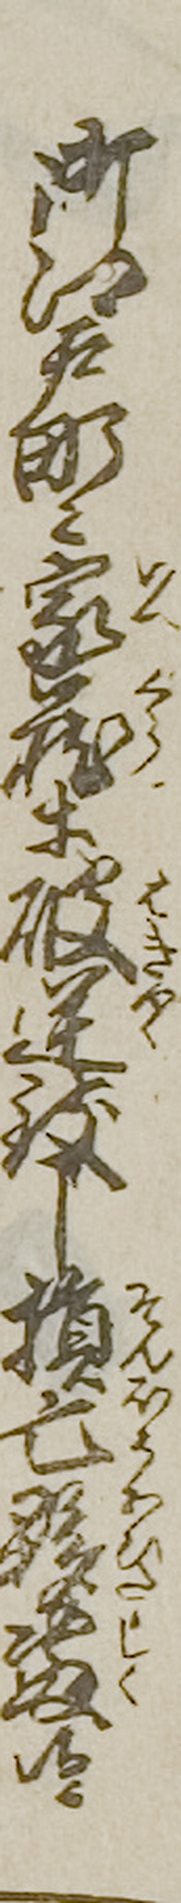御江戸町々家蔵等破逆致し損亡夥敷候に
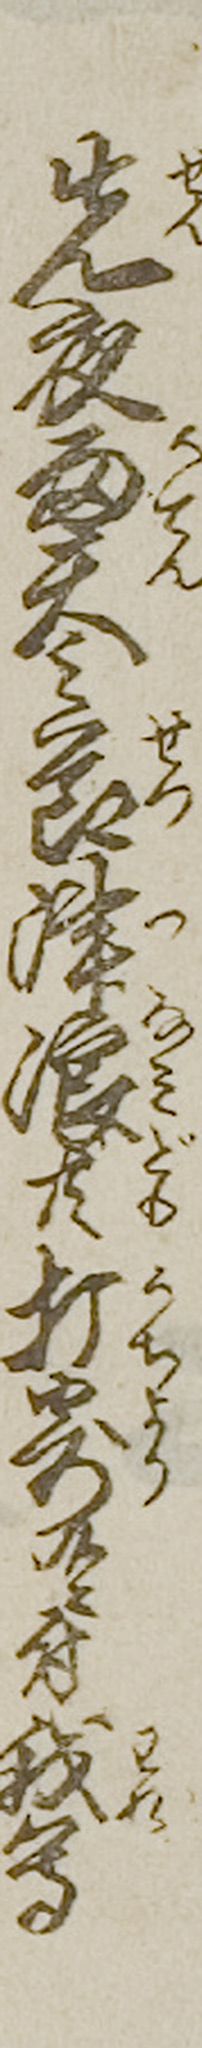先夜雨天の節津波共打寄候に付我等
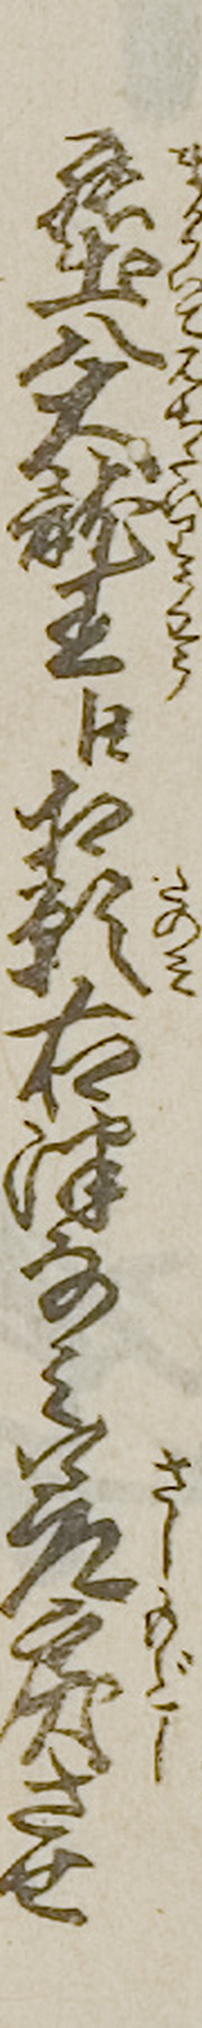罷出八大龍王江相頼右津なみ差戻させ
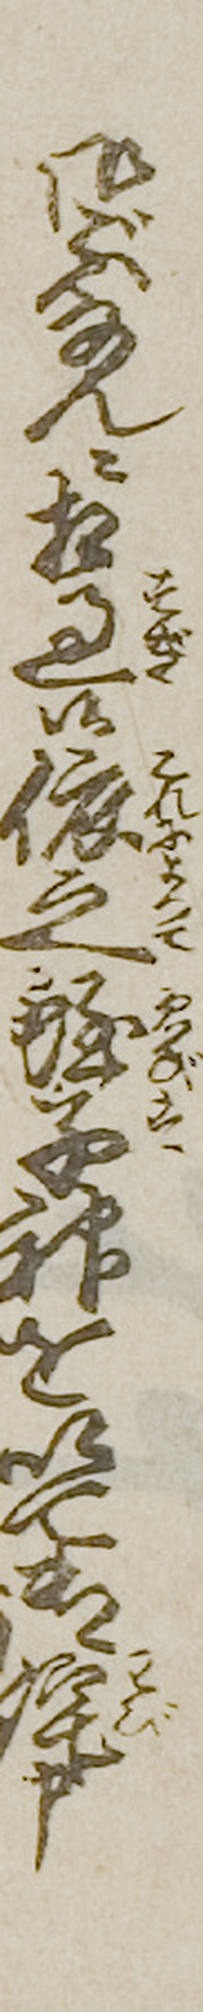御ぶなんに相過候依之蛭子神を以て御詫申
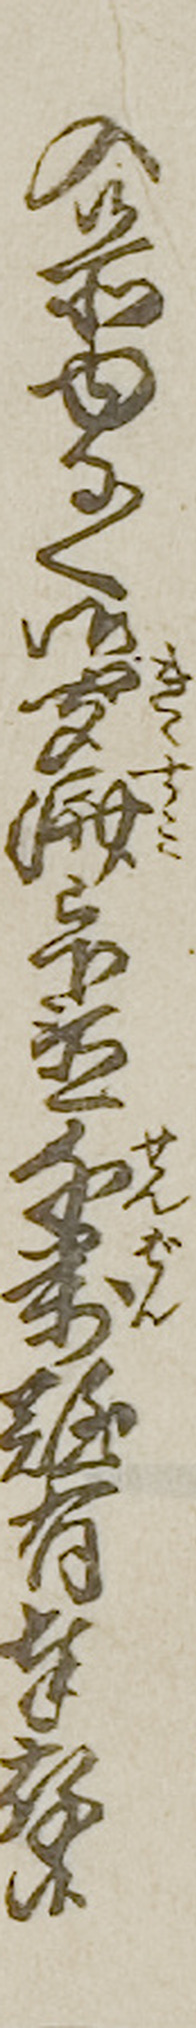入候所ゆる〳〵御聞済被下置千万難有奉存候
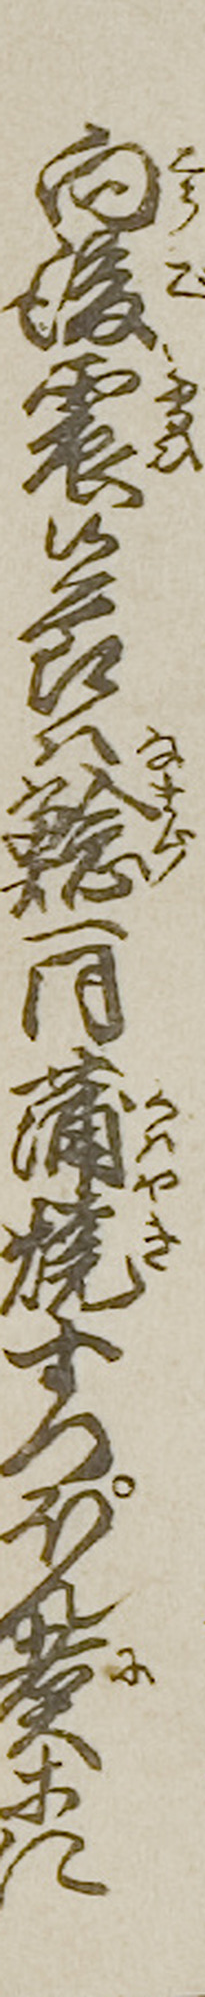向後震候節は鯰一同蒲焼すつぽん煮等に
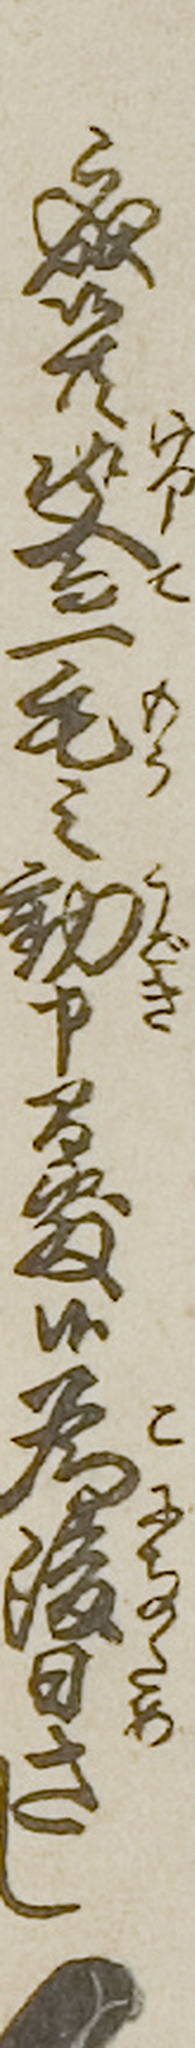被成候共決而一毛の動申間敷候為後日さし
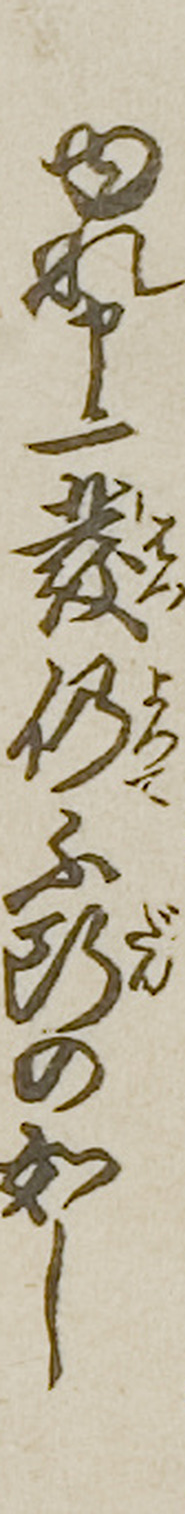ゆれ申一発仍不断の如し
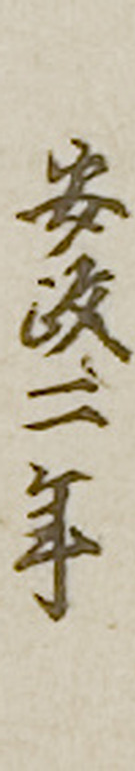安政二年
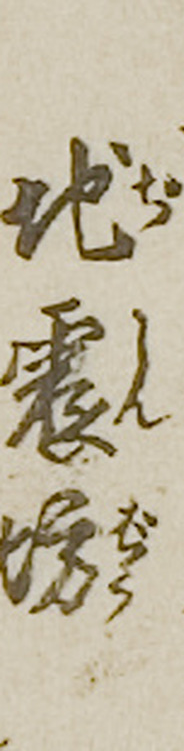地震坊
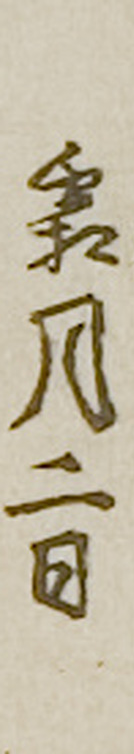霜月二日
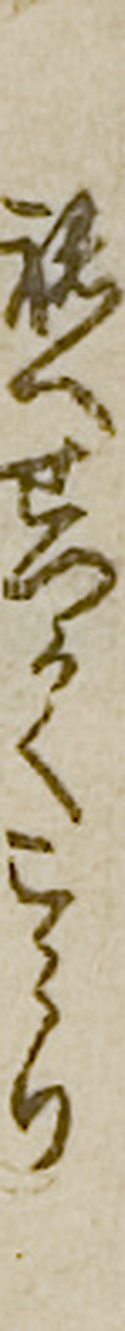ねへせつかくこうり
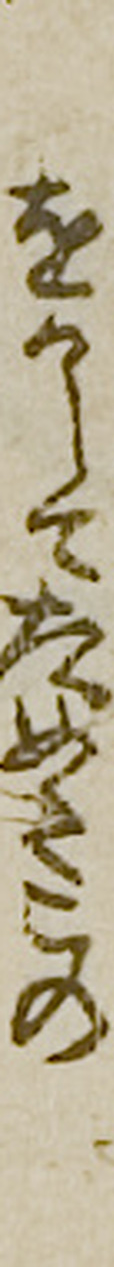をかしてためたこの
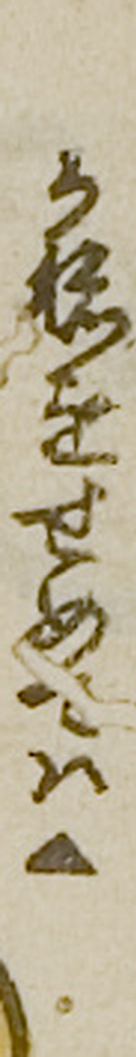かねをせめては▲
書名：[鯰に金銀を吐かされる持丸]
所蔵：東京大学総合図書館 General Library in the University of Tokyo, JAPAN
